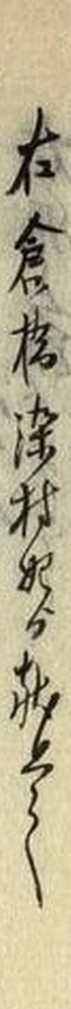右倉橋染村始ゟ献上之
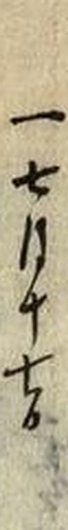一七月十七日
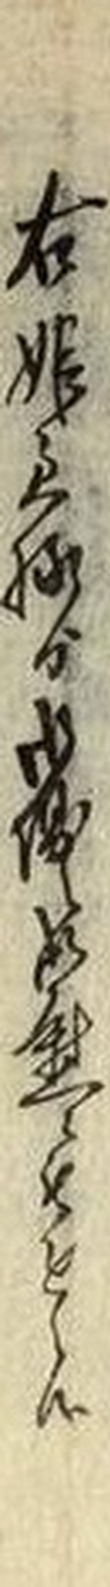右姫君様ゟ御側之御慰ニ被進之候
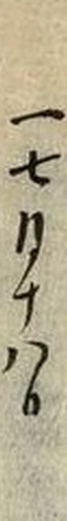一七月十八日
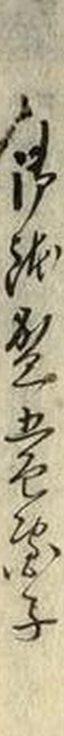御鉢盛五色団子
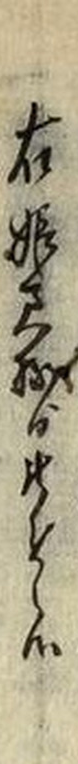右姫君様ゟ被進之候
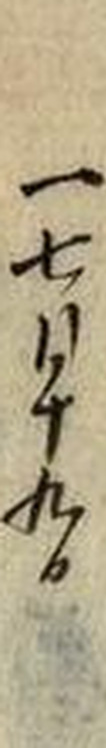一七月十九日

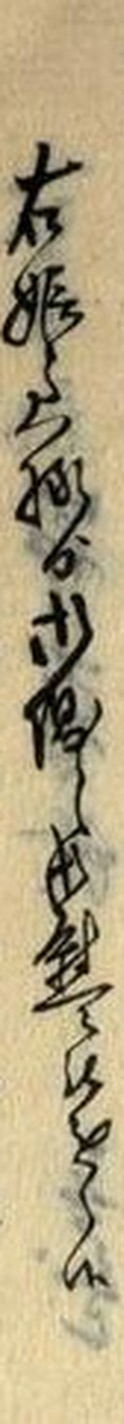右姫君様ゟ御側へ御慰ニ被進之候
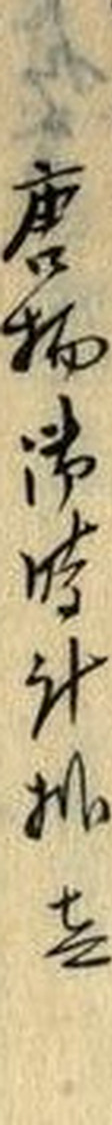唐物御時計掛壱
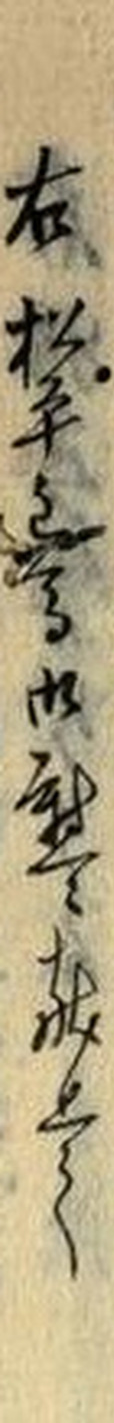右松平主馬御慰ニ献上之
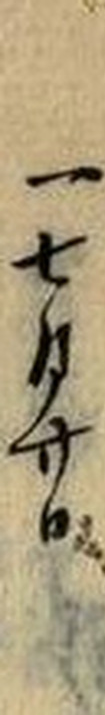一七月廿日
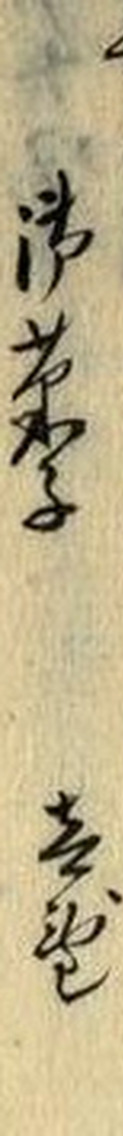御菓子壱台
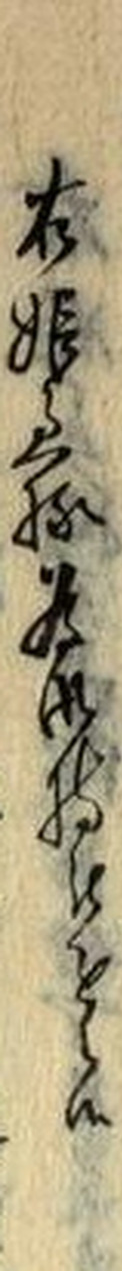右姫君様為御持被進候
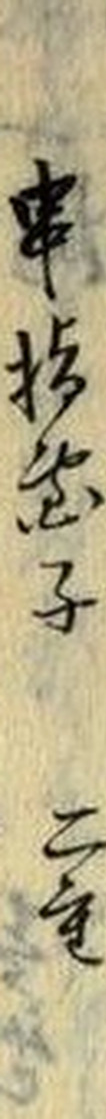串指団子二重
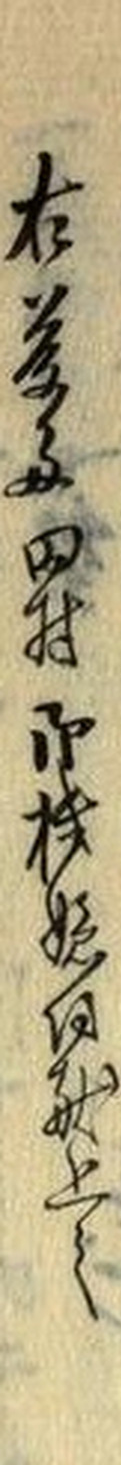右藤多田村御機嫌伺献上之
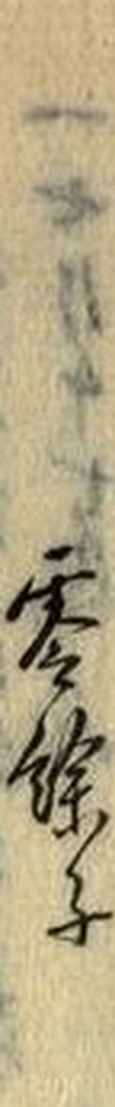零餘子
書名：少傅日録抄（斉承付側向頭取日記、在府）
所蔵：福井県文書館 Fukui Prefectural Archives
